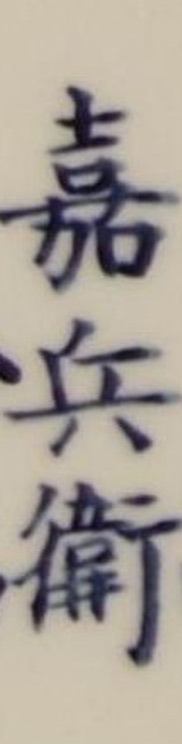嘉兵衛

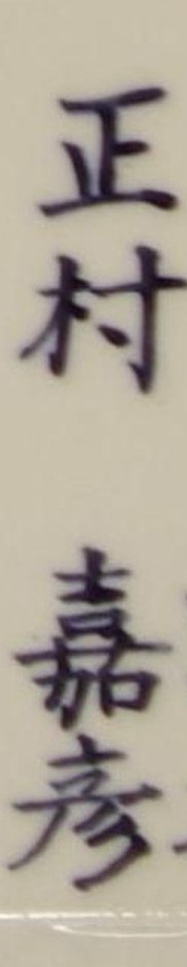正村嘉彦
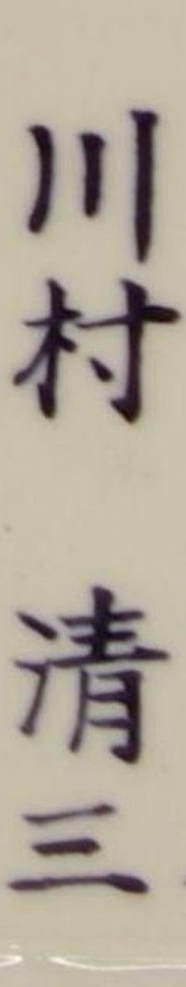川村清三
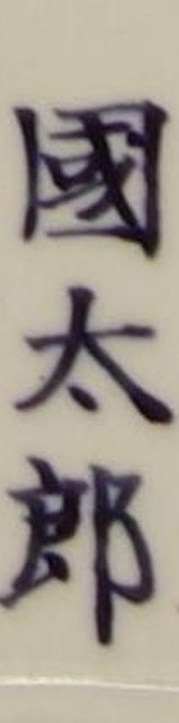國太郎
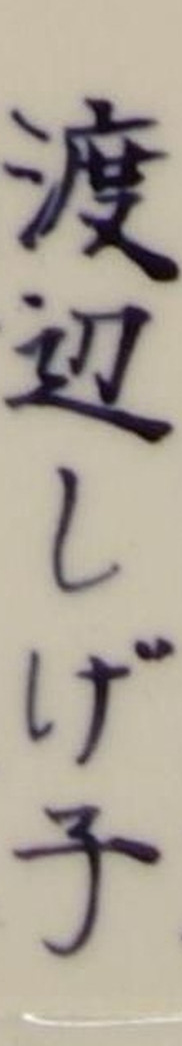渡辺しげ子
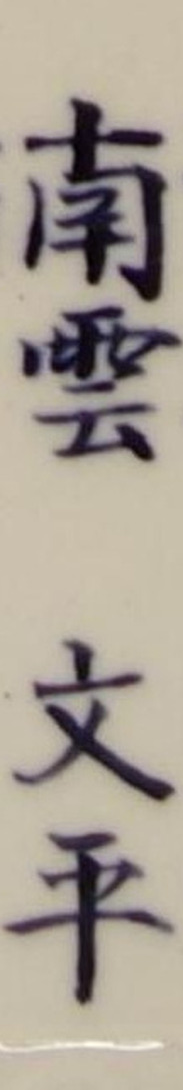南雲文平
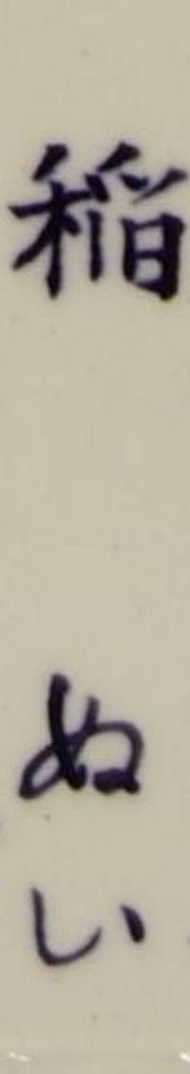稲ぬい
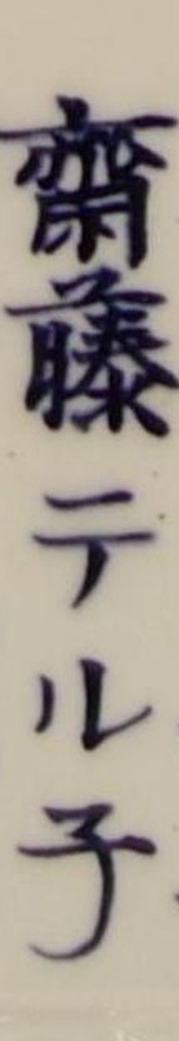斎藤テル子
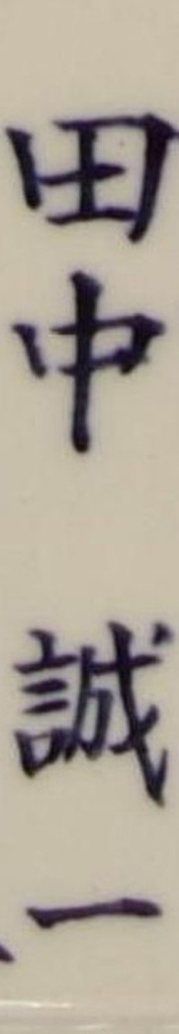田中誠一
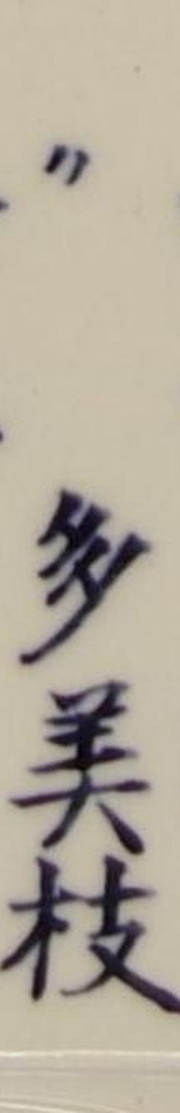多美枝
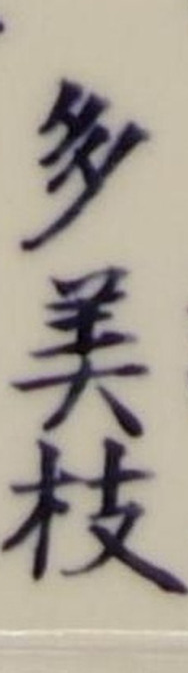多美枝
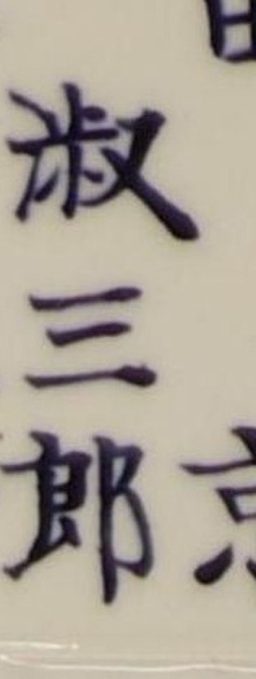淑三郎
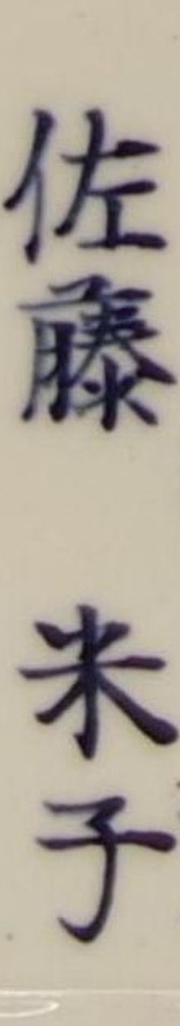佐藤米子
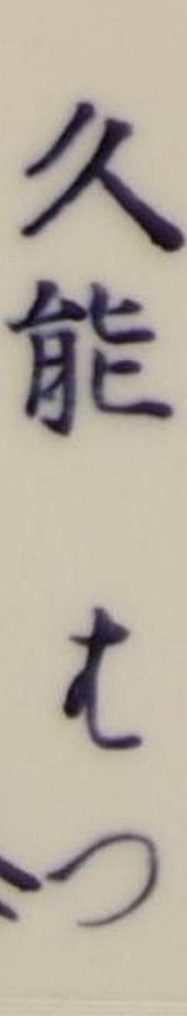久能はつ
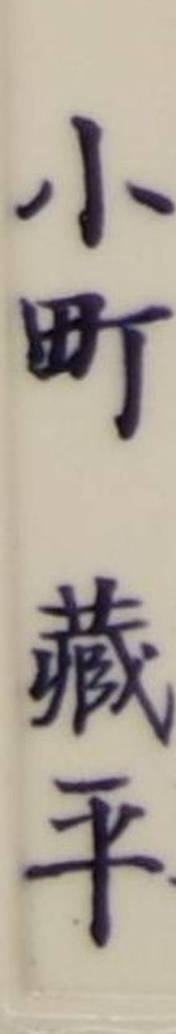小町蔵平

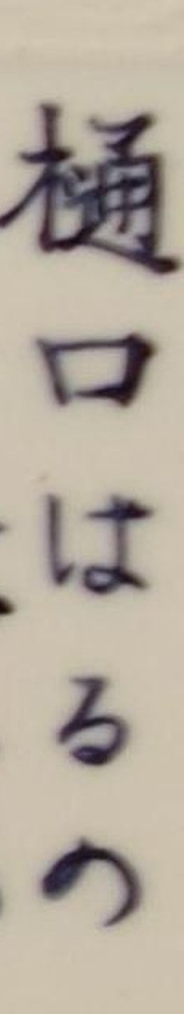樋口はるの
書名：E~L
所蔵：高野山金剛峯寺
